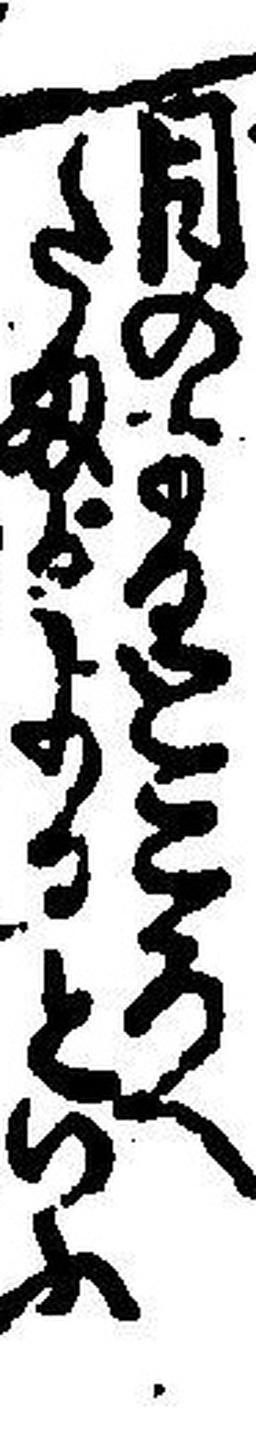たまがよるといふ
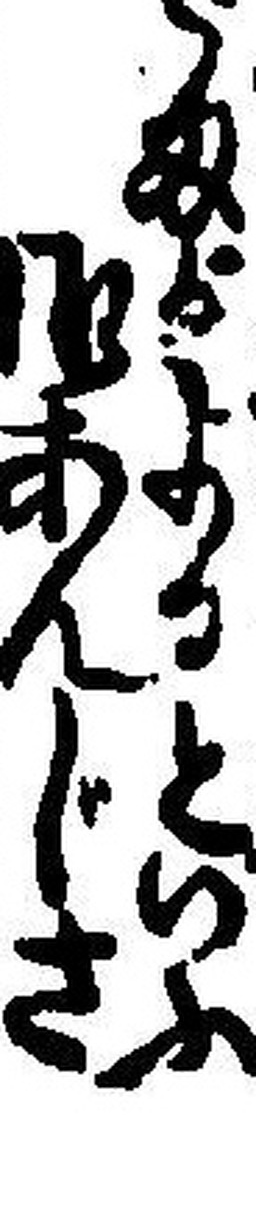御あんじさ

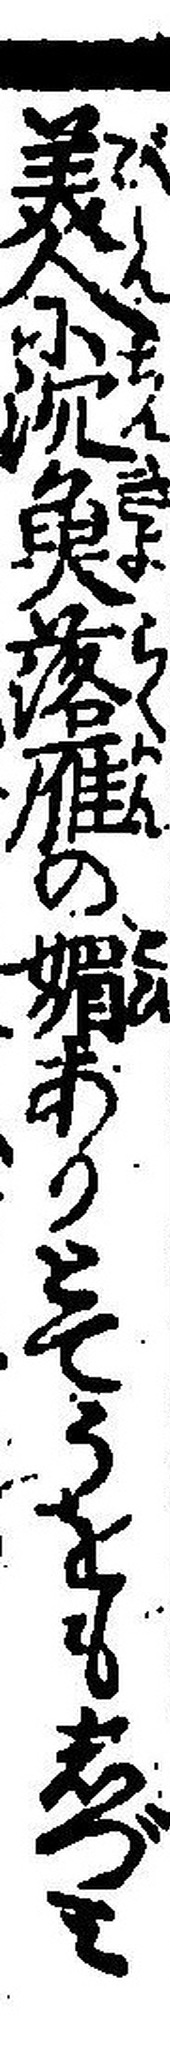美人に沈魚落雁の媚ありとてうをもしづみ
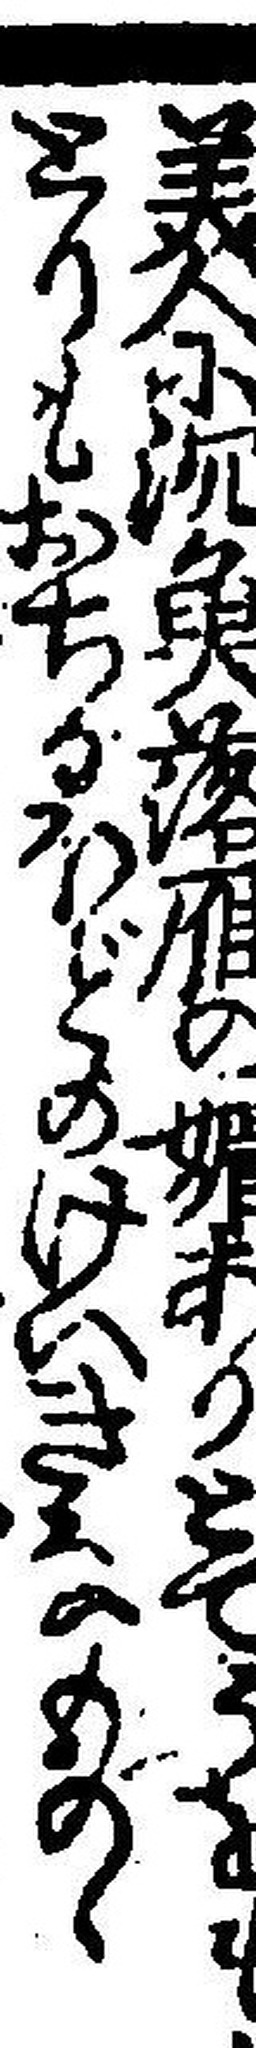とりもおちるほどのけいきなものゝ
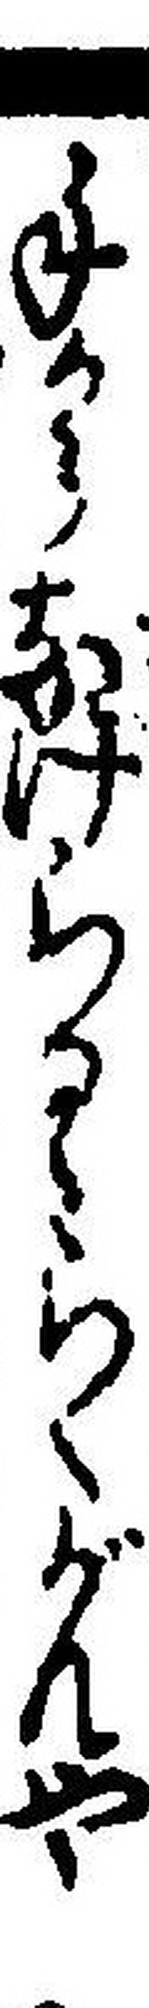手かみなけらるゝらくがんや
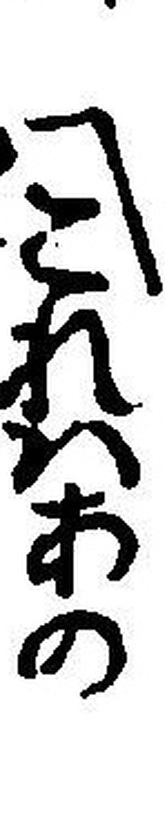〽これはあの
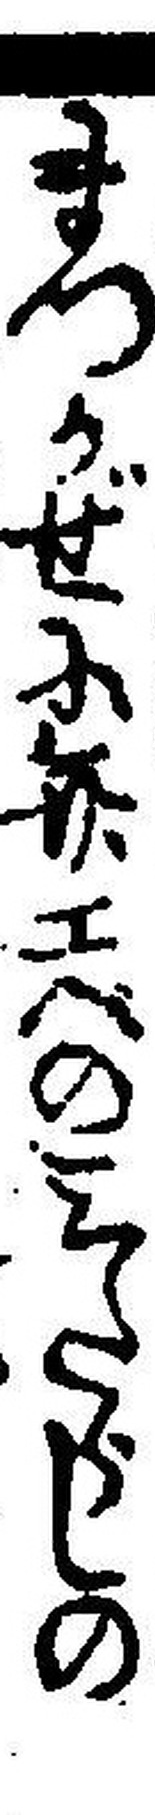まつかぜに弁エベのみたらしの
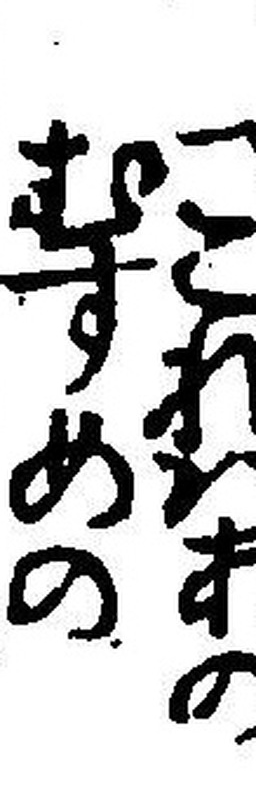むすめの
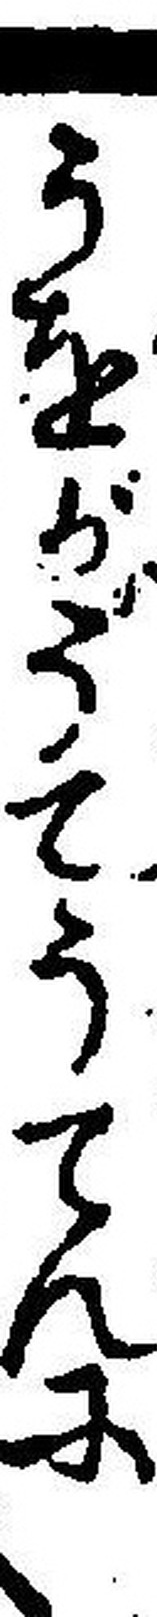うをがうてうてんに
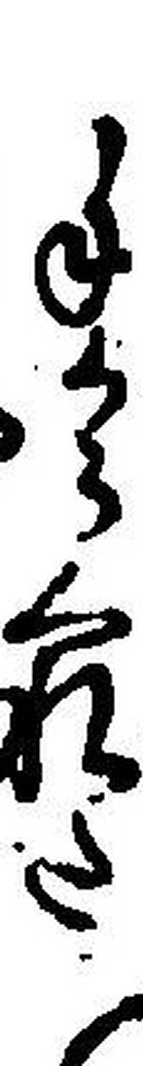手からくれた
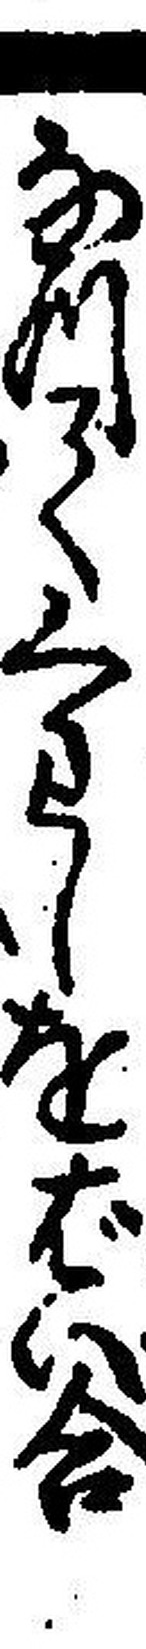なつてくわしをばい合
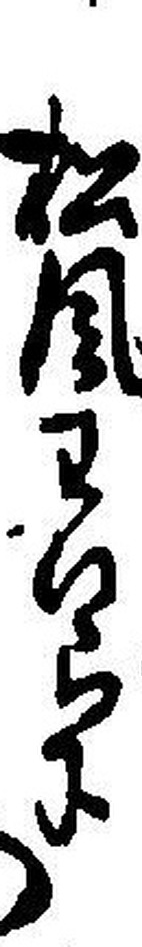松風わいらに
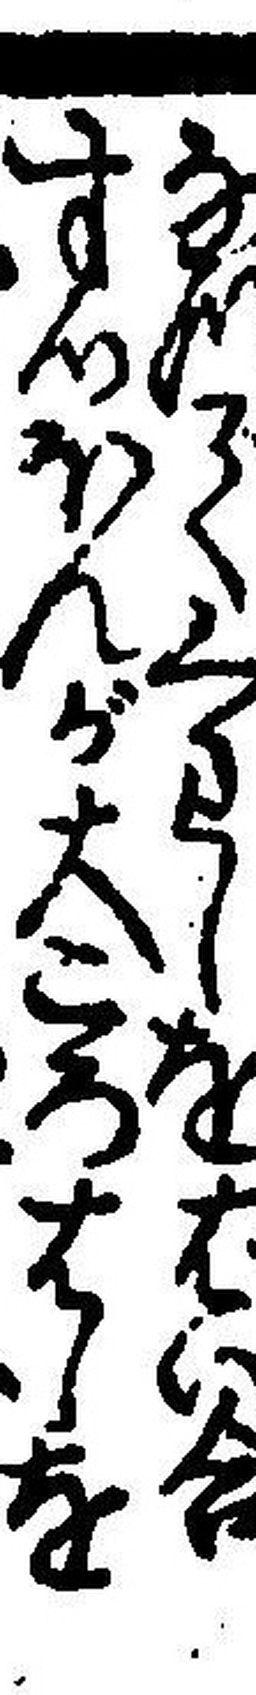すつほんが大ころはしを
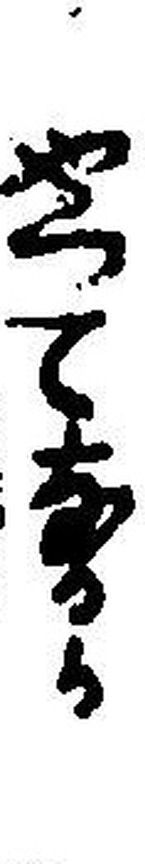やつてなるか
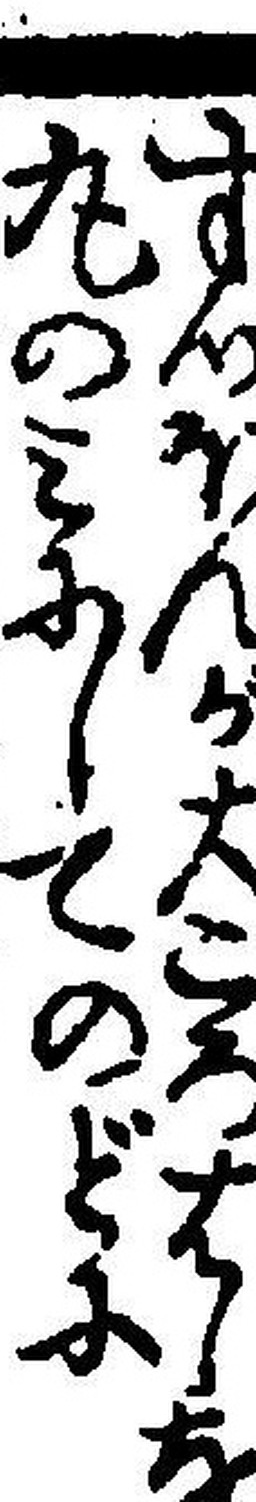丸のみにしてのどに
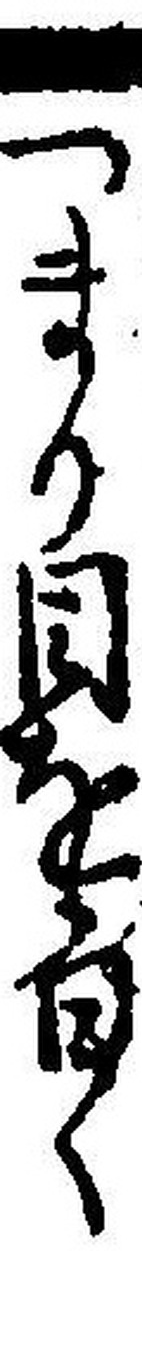つまり目を白く
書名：徳若水縁起金性 / 樹下石上作
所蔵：東京大学総合図書館 General Library in the University of Tokyo, JAPAN
